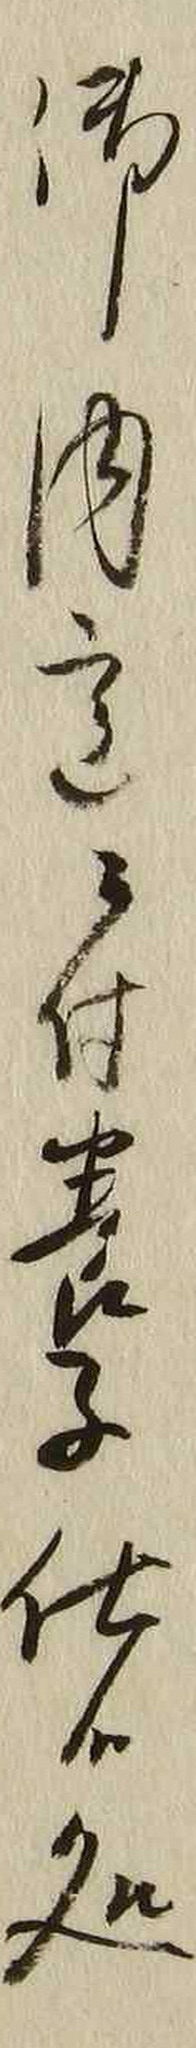御内意ニ付養子仕候処
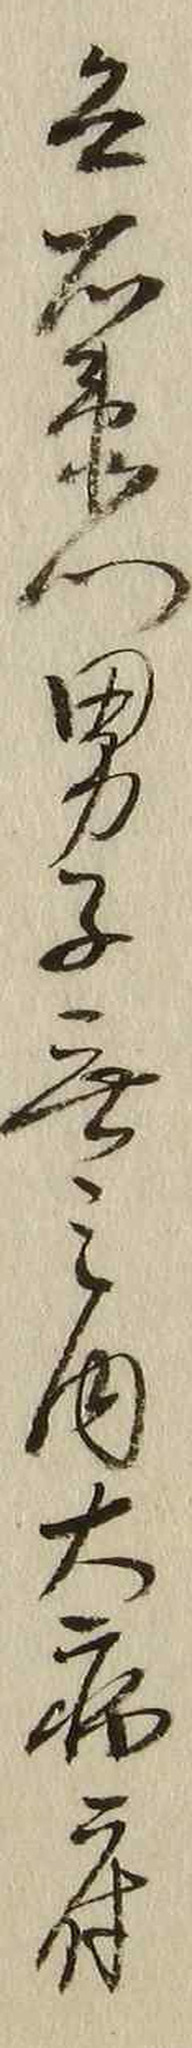兵右衛門男子無之内大病ニ付
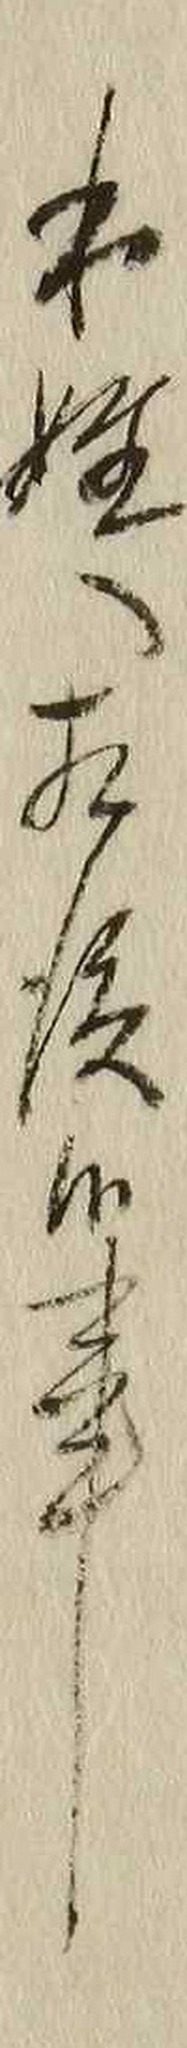本姓へ相渡候事
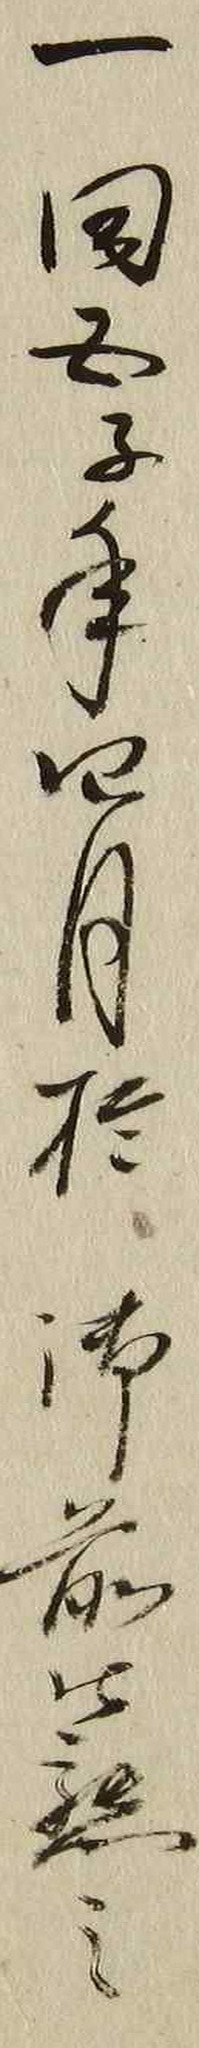一同五子年四月於御前御懇之
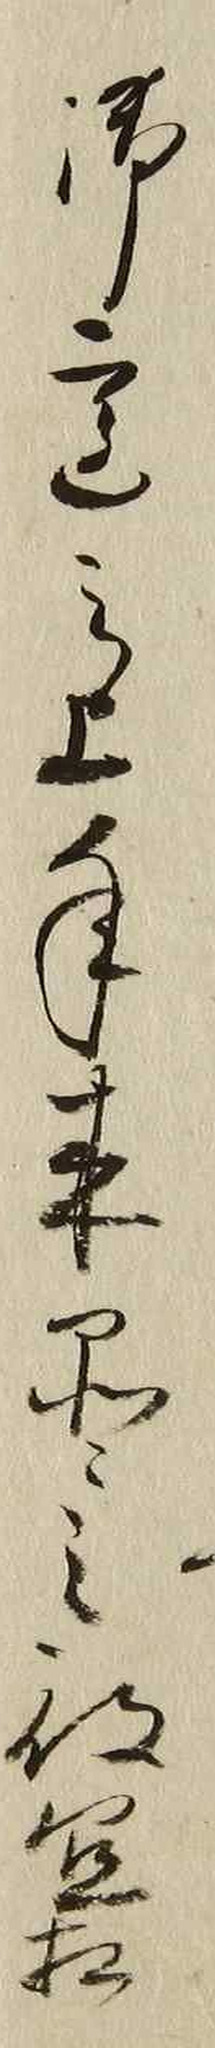御意之上年来品々之役宜相
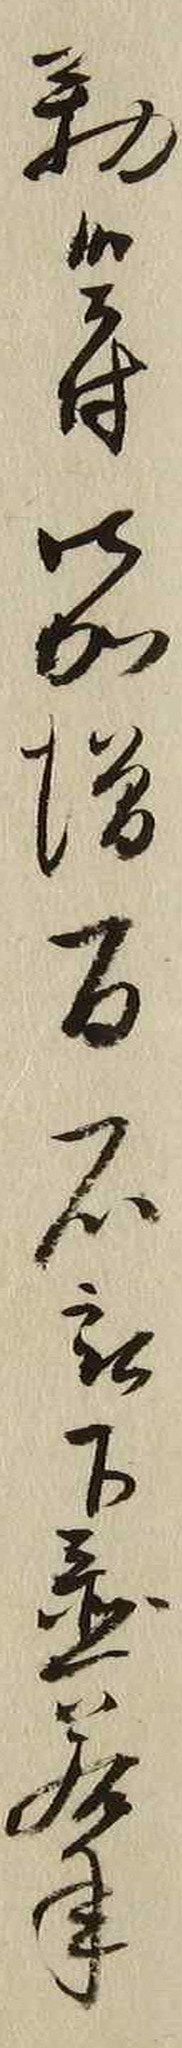勤候ニ付御加増百石被下置若年
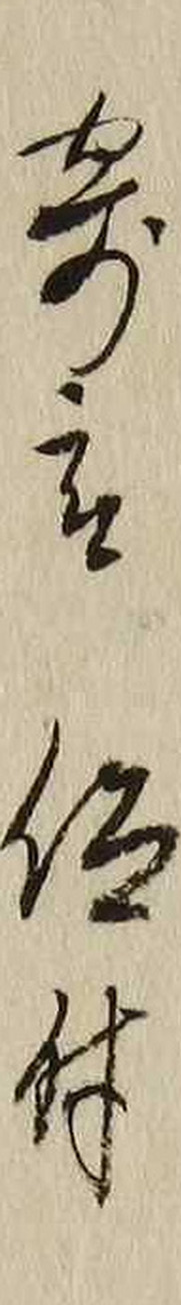寄被仰付
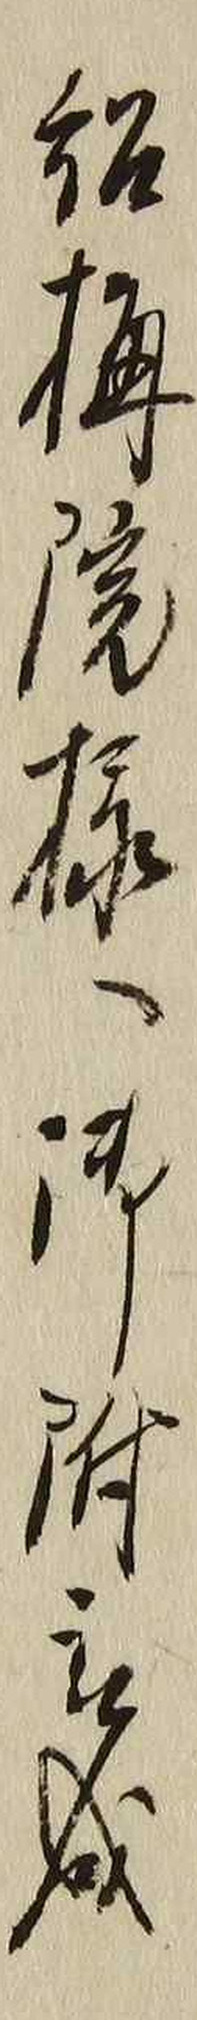紹栴院様へ御附被成
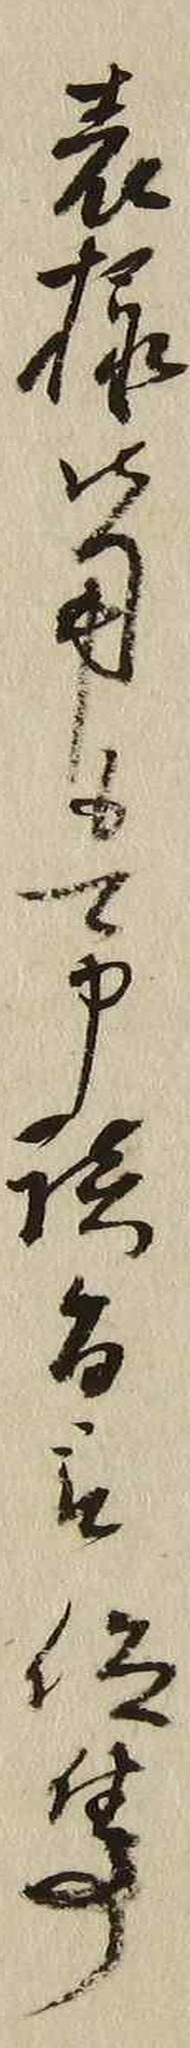表様御用も可申談旨被仰付候事
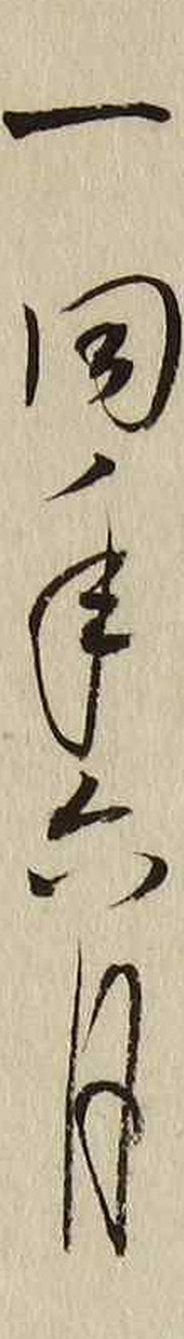一同年六月
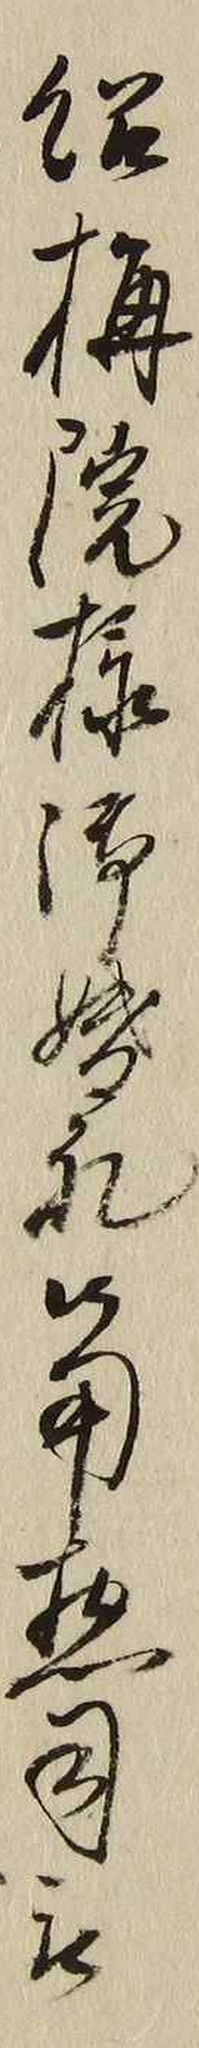紹栴院様御婚礼御用惣司被
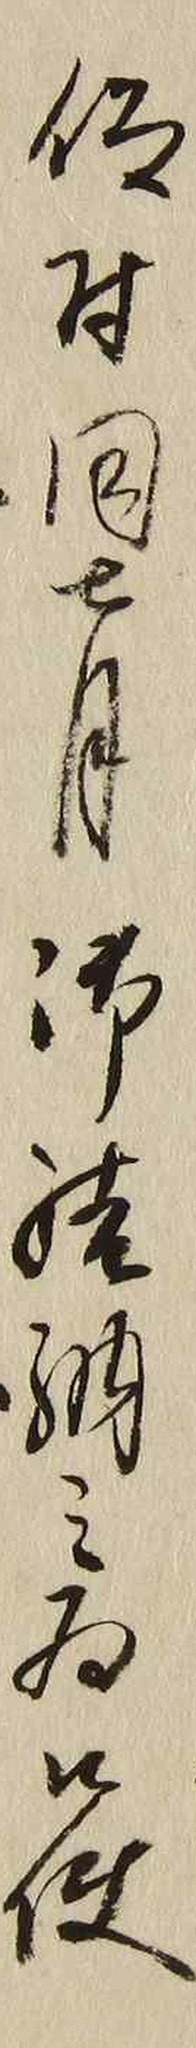仰付同七月御結納之為御使
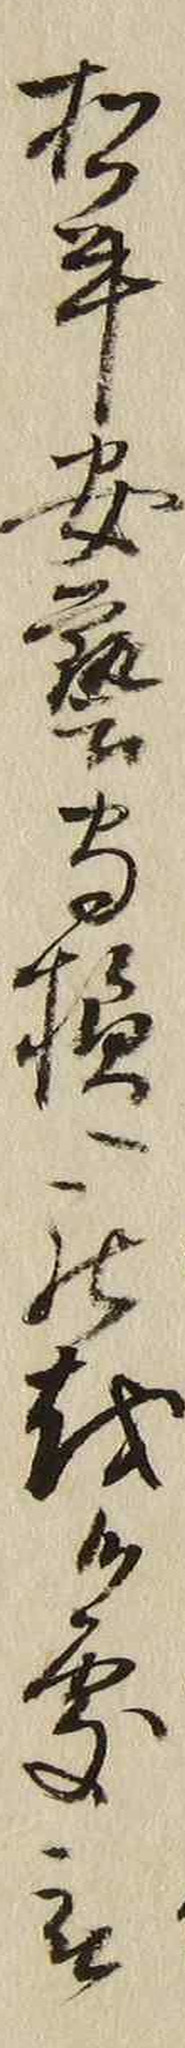松平安芸守様へ罷越候処被
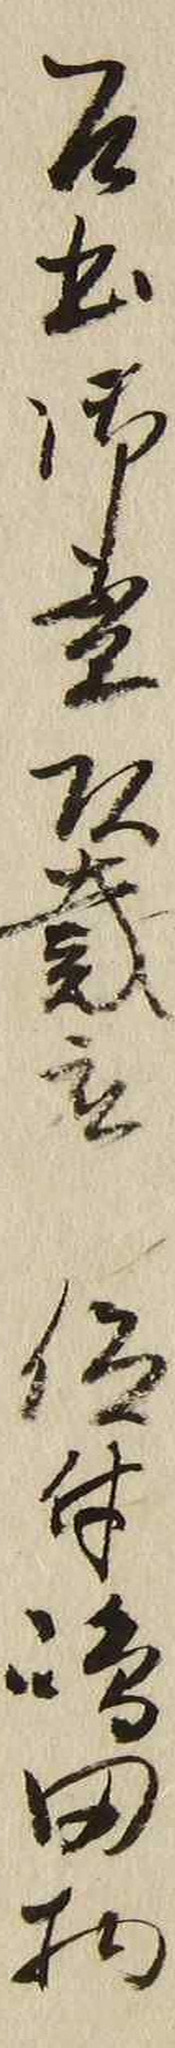召出御盃頂戴被仰付島田物
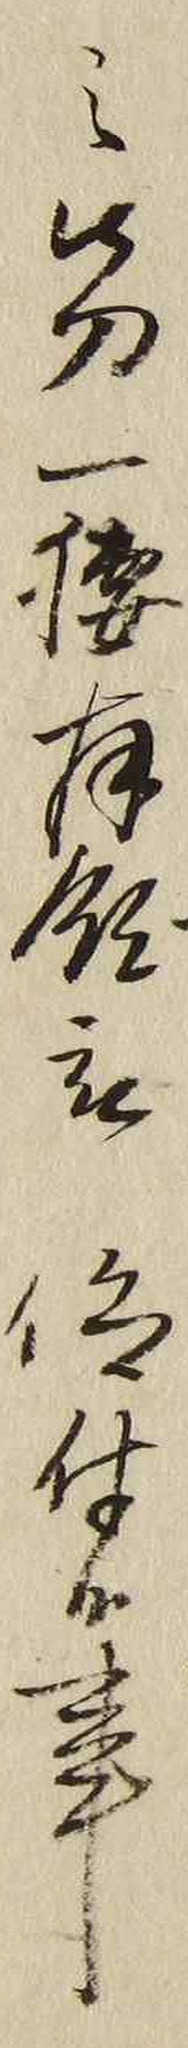之御刀一腰拝領被仰付候事

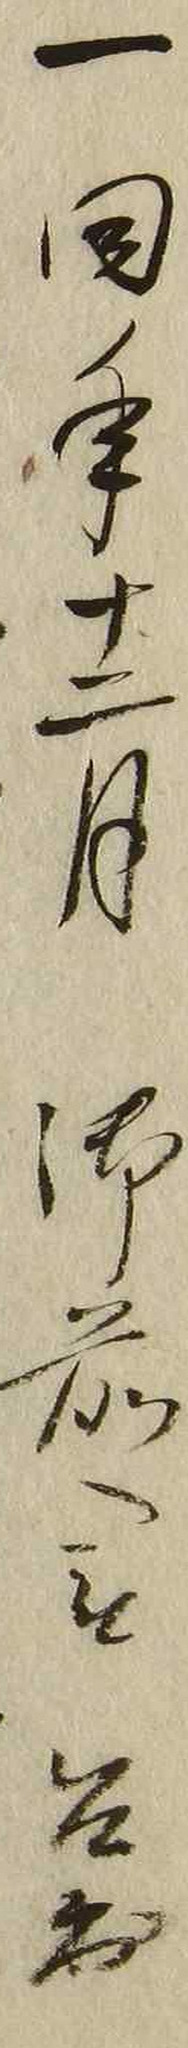一同年十二月御前へ被召出
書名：諸士系譜　巻之351　す之部1
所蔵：会津若松市立会津図書館
